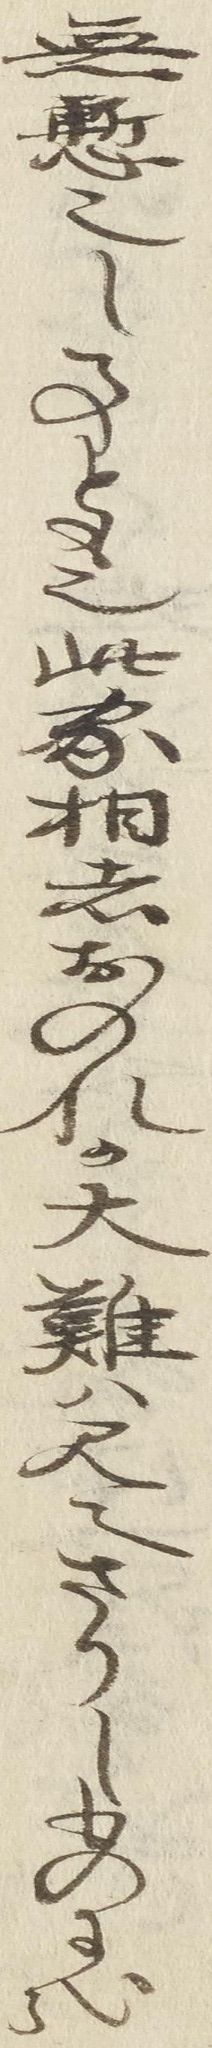無慙也し事とも也此家相者おのれの大難は見えさりしものに哉
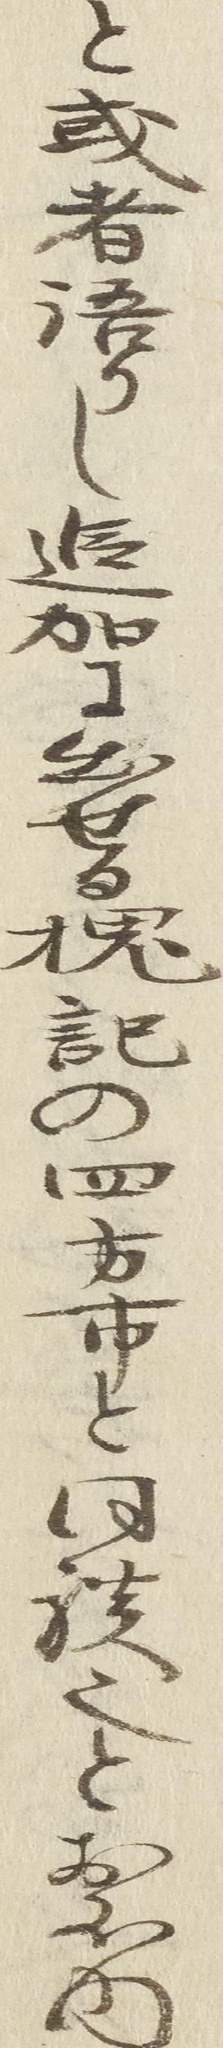と或者語りし追加に出せる塊記の四方市と同談也とおほゆ
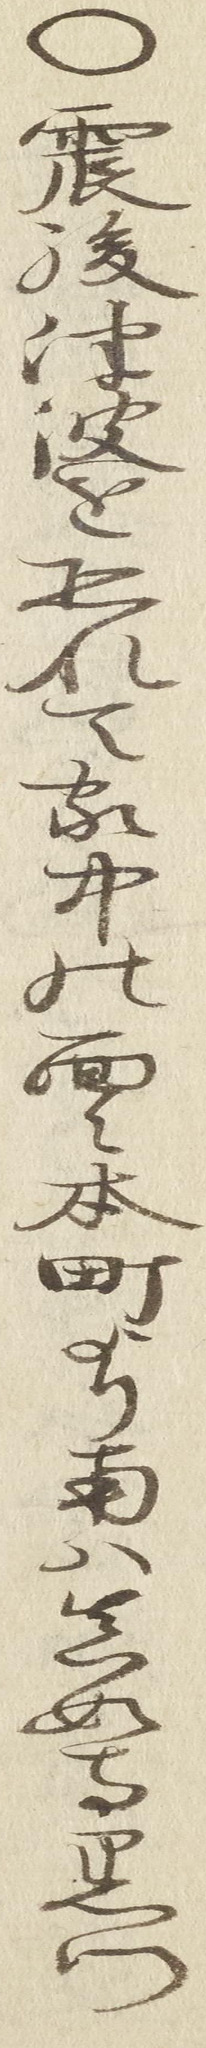〇震後津波を恐れて家中の面々本町より南は真如寺黒門
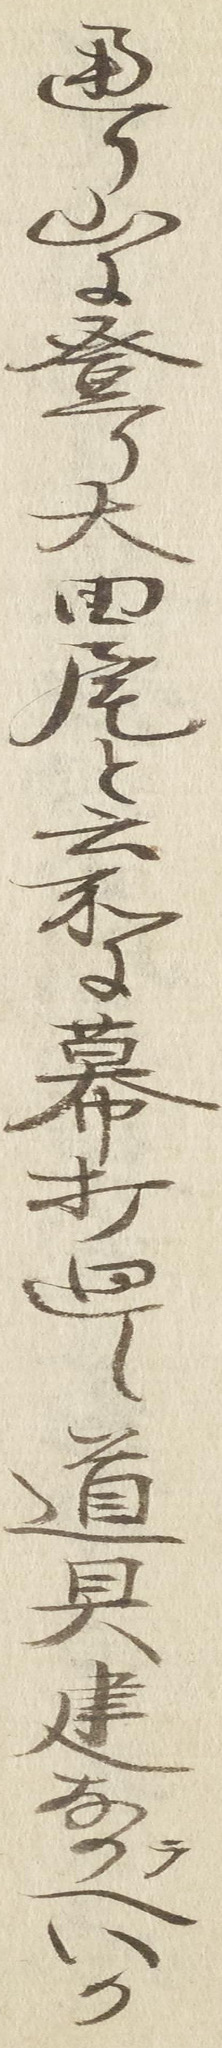通り山に登り大田尾と云所に幕打回し道具建なかへいか
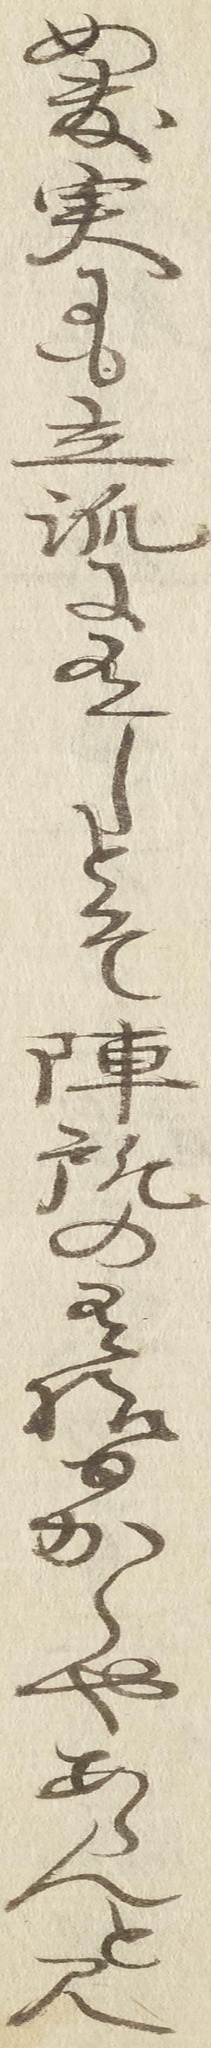め敷実にも立派に有しとそ陣所の有様もかくやあらんと見
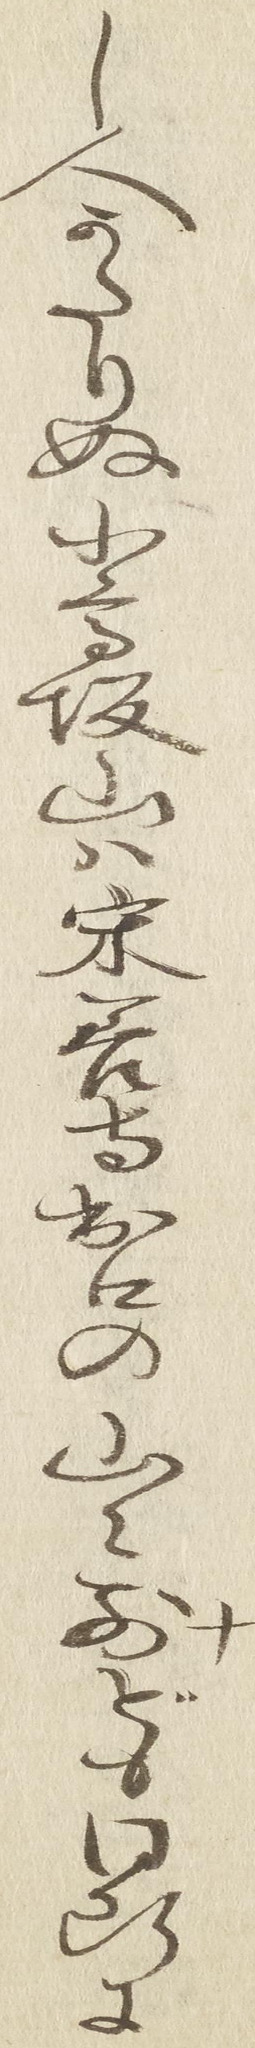し人かたりぬ小高坂山は宋善寺出口の山々前ども同断に
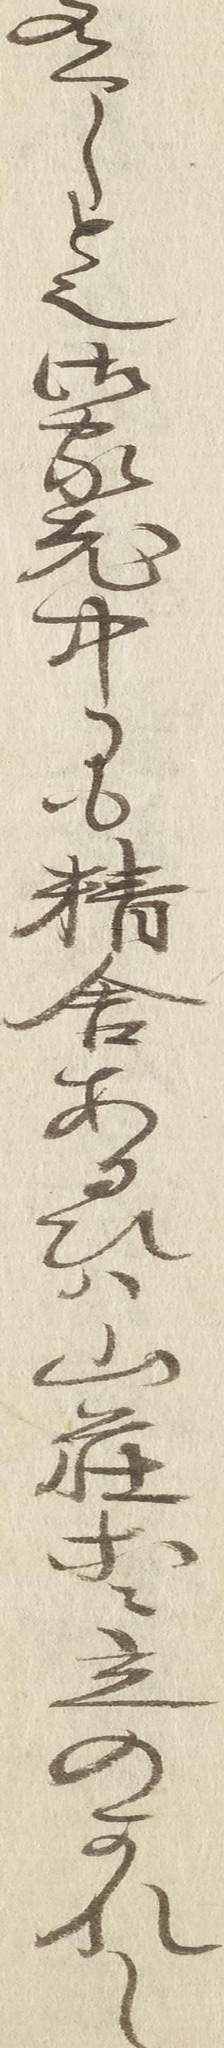有しとなり御家老中にも精舎あるひは山荘等に立のかれし
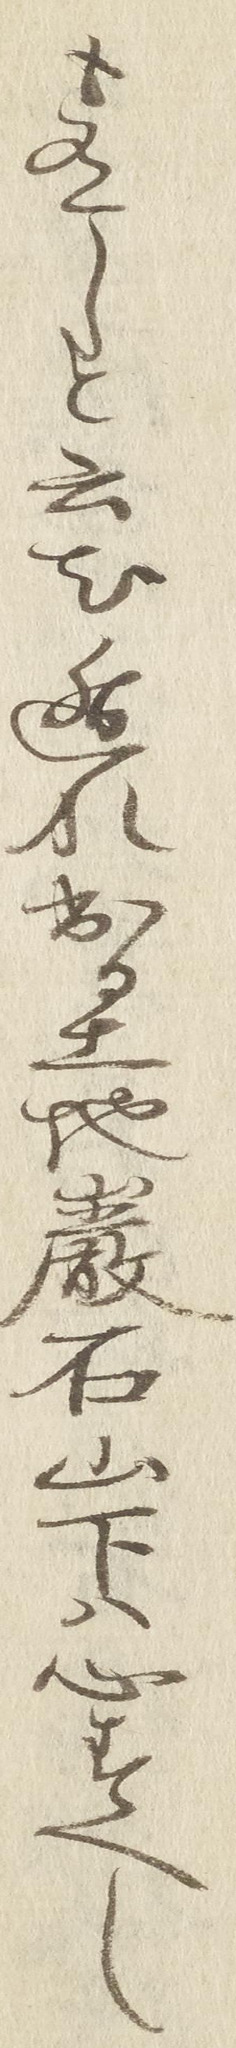も有しと云尤遁れ出る土地巌石山下は心すへし
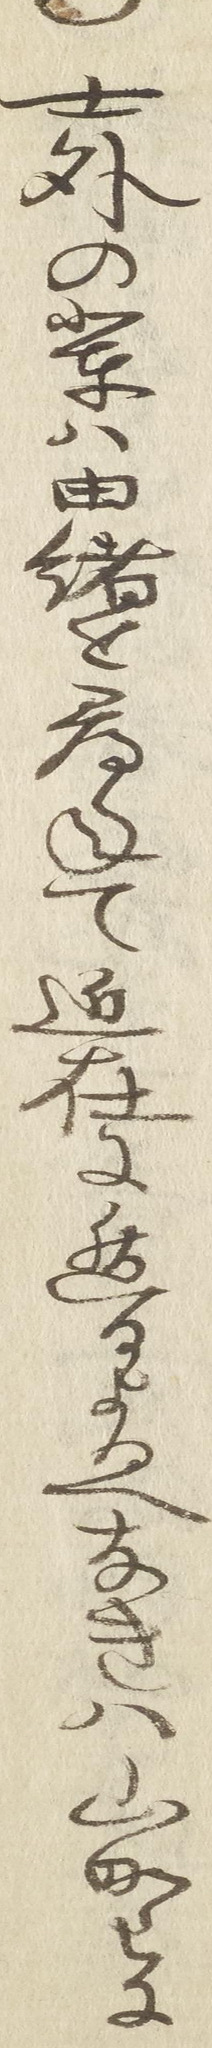〇士外の輩は由緒を尋ねて近在に遁るよるへなきは山野に
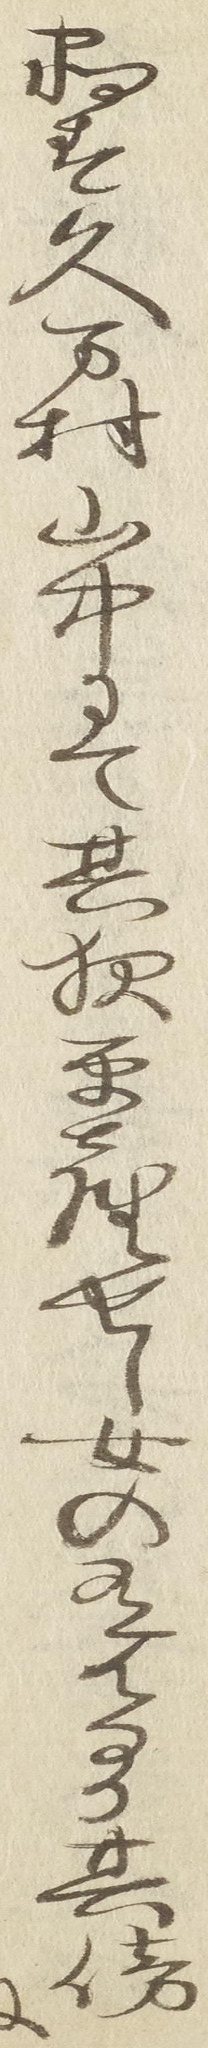昼は久万村山中にて其夜平産せし女の有けるか其傍に
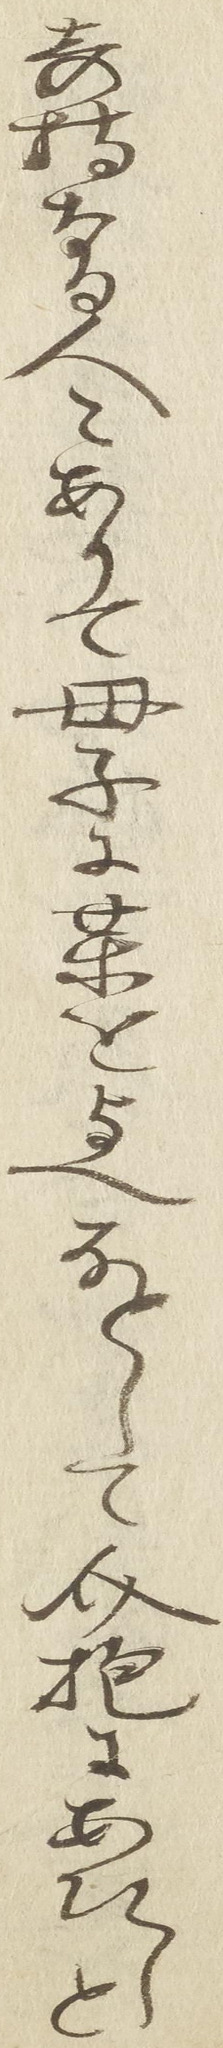奇特なる人々ありて母子に薬を与へなとして介抱にあひしと
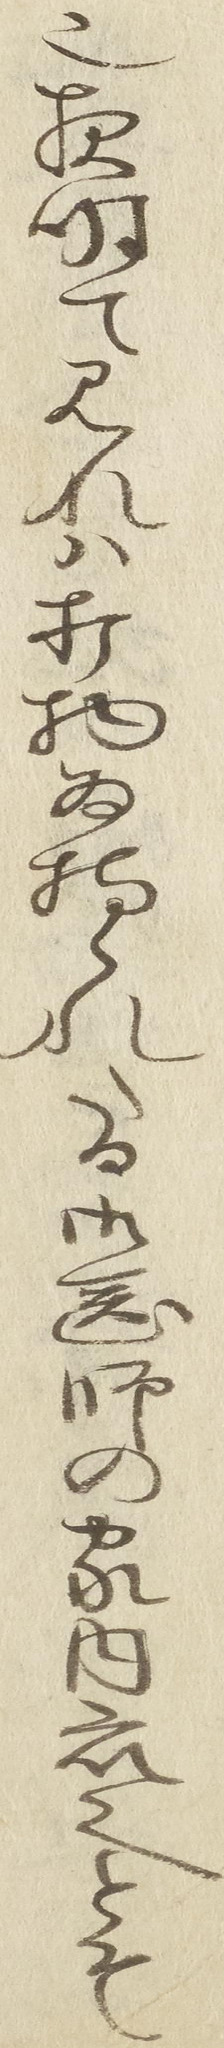也夜明て見れは折柄為持くれたる御医師の家内衣也とそ

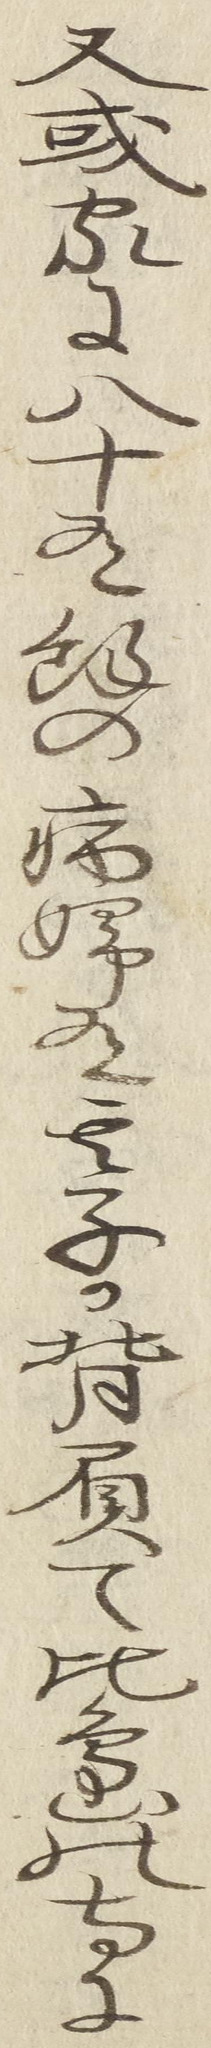又或家に八十有余の病婦有其子か背負て比島山の寺に
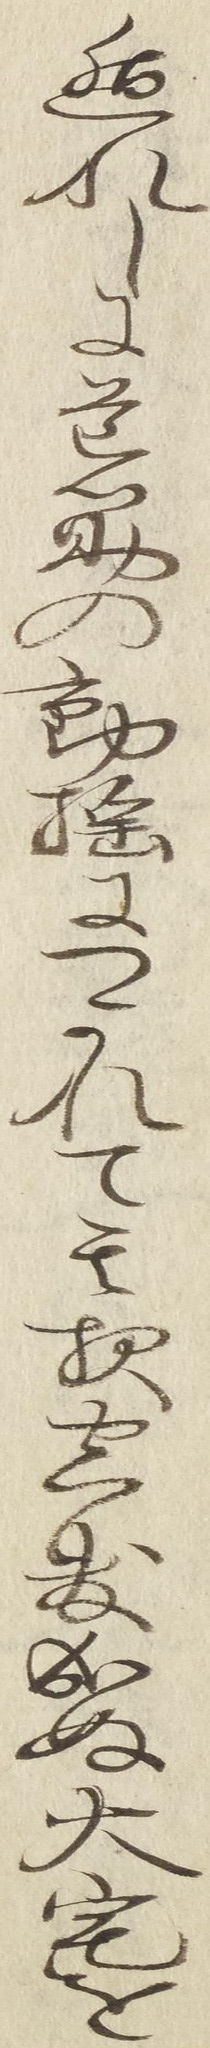遁れしに道筋の動揺につかれて其夜空敷成ぬ大宅を
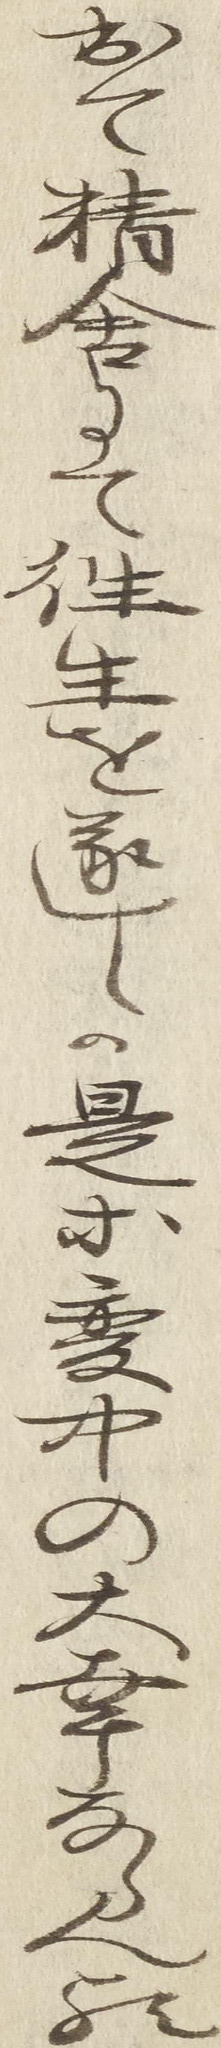出て精舎にて往生を遂しか是等変中の大幸ならん歟
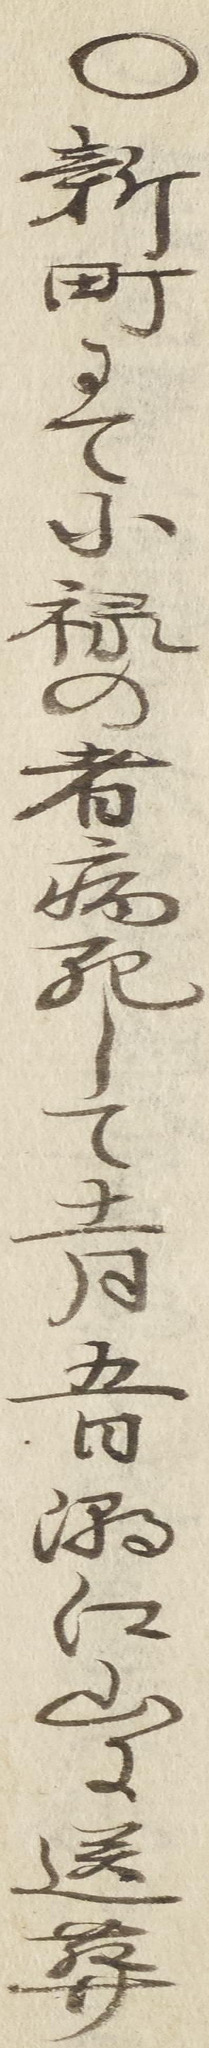〇新町にて小緑の者病死して十一月五日潮江山に送葬
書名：地震記　上
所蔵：東京大学地震研究所図書室 Earthquake Research Institute Library, The University of Tokyo, JAPAN
